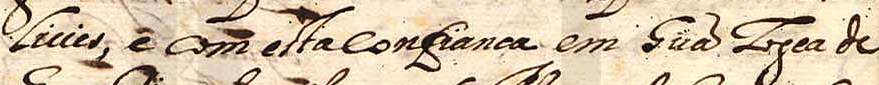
licies, e com esta confiança em huā Logea de
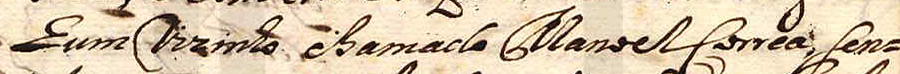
hum Vizinho chamado Manoel Correa, sen
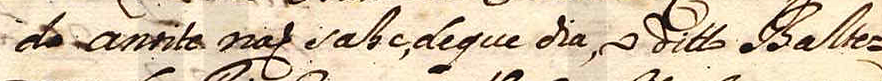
do a noite naõ sabe, de que dia, o ditto Balte
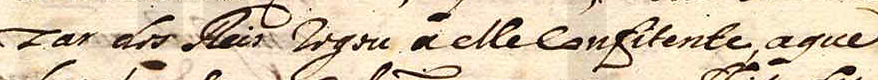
zar dos Reis Rogou a elle confitente, a que
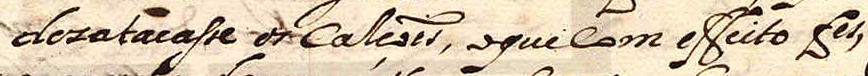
dezatacasse os calçoẽs, o que com effeito fes,
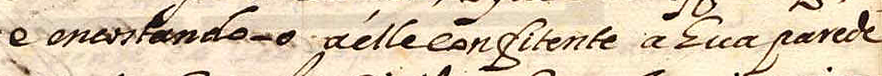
e encostando-o a elle confitente a hua parede
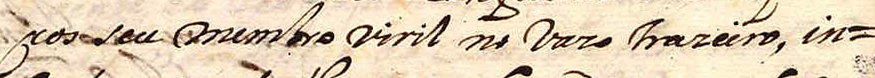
pos seu membro viril no vazo trazeiro, in
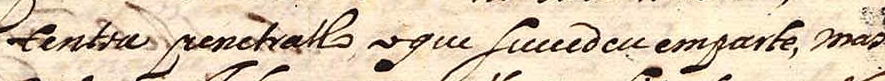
tentou penetrallo o que succedeu em parte, mas
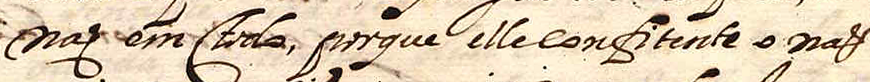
naõ em todo, porque elle confitente o naõ
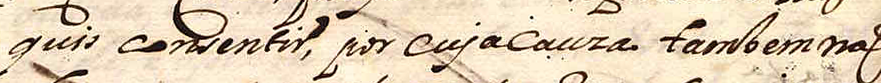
quis consentir, por cuja cauza tambem naõ
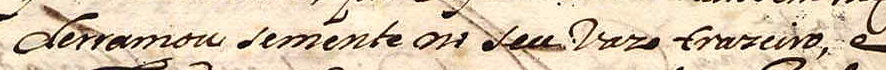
derramou semente no seu vazo trazeiro, e
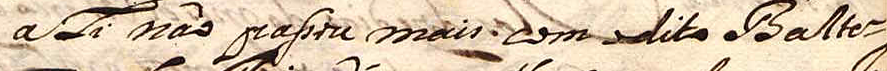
ali não passou mais com o dito Balte
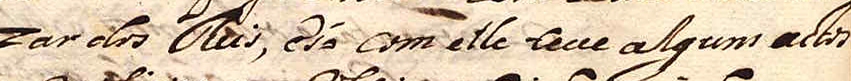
zar dos Reis, e só com elle teue alguns actos
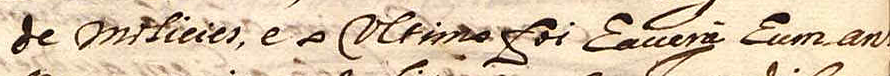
de molicies, e o Vltimo foi hauerá hum an
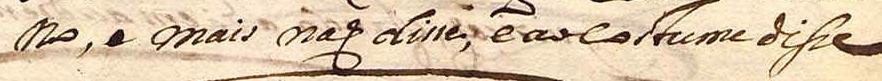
no, e mais naõ disse, e ao costume disse
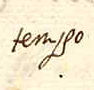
tempo
